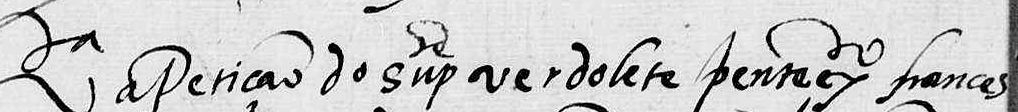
Vta a Petiçaõ do supte verdolete penteeyro frances
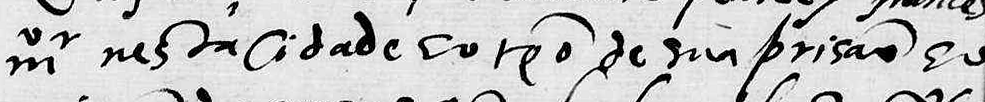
mor nesta Cidade E o tpō de sua prisaõ E o
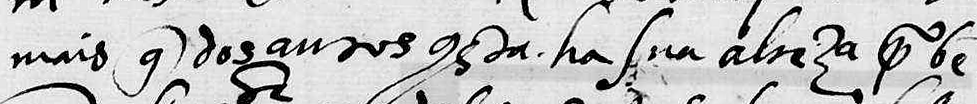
mais q̄ dos autos ꝯsta ha sua alteza p̄o bē
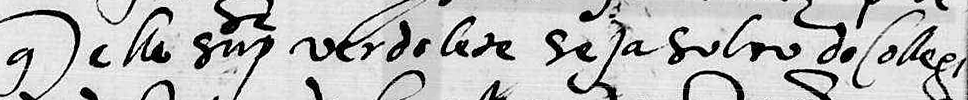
q̄ elle supte verdolete seJa solto do Collegi
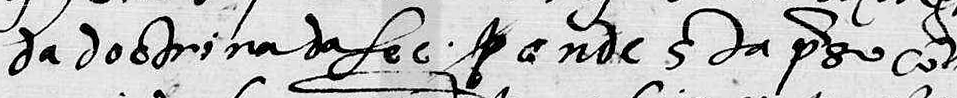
da doctrina da fee ꝑ onde sta p̄so cō
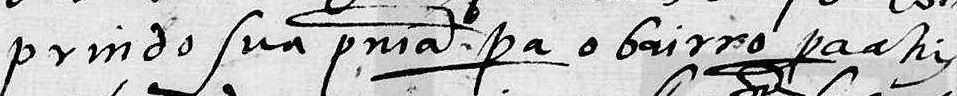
prindo sua pniā ꝑa o bairro ꝑa ahy
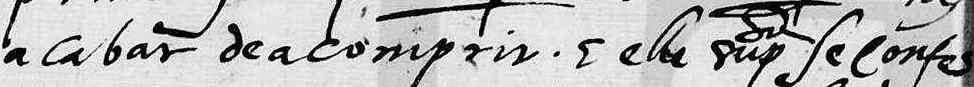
acabar de a comprir. E elle supte se confe
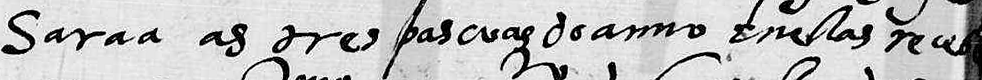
Saraa as tres pascoas do anno E nellas receb
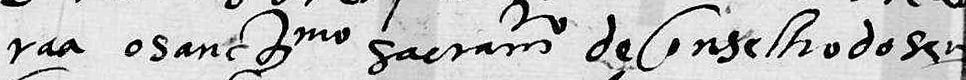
raa o sanctjmo sacramto de Conselho do seu
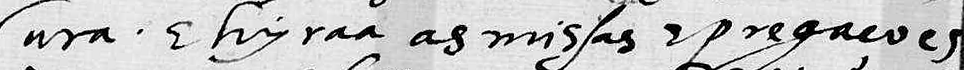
Cura. E hyraa as missas E pregaçoes
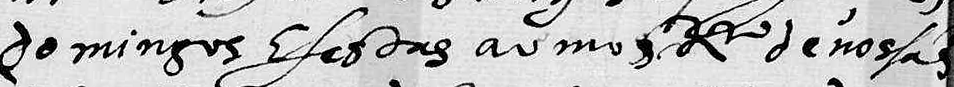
domingos E festas ao mostro de nossa s
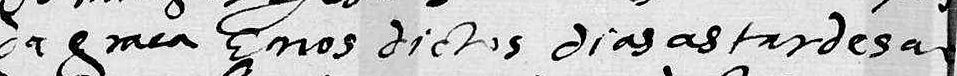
da graça E nos dictos dias as tardes a
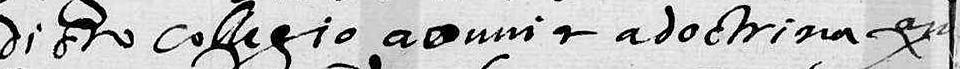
dicto collegio a ouuir a doctrina Xam
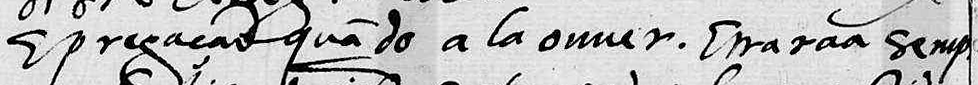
E pregação quādo a la ouuer E traraa semp
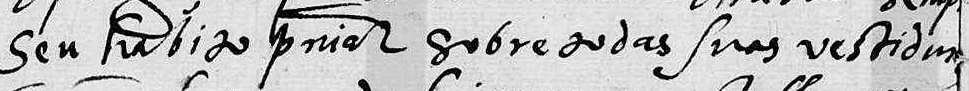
seu habito pn̄iaL sobre todas suas vestidu
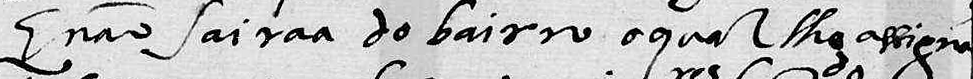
E não sairaa do bairro o qual lhe assigna
